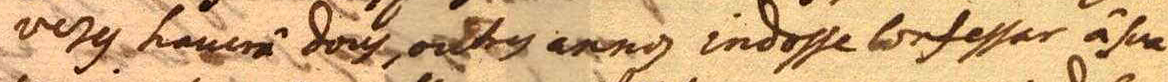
vezes hauerá dous, ou tres annos indosse confessar á sua
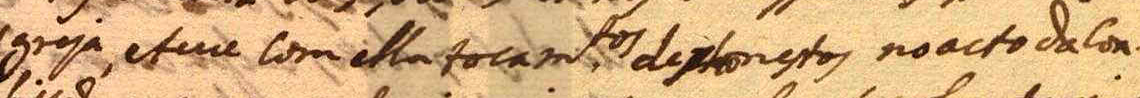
jgreja, e teue com ella tocam.tos deshonestos no acto da Con
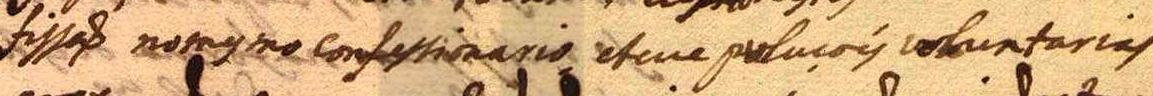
fissaõ no mesmo confessionario, e teue poluçoẽs uoluntarias
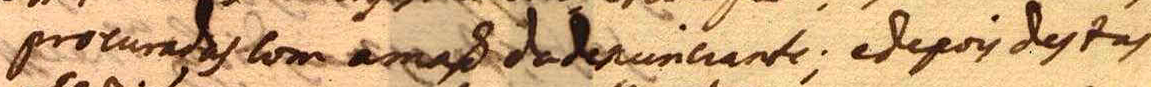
procuradas com a maõ da denunciante; e depois destas
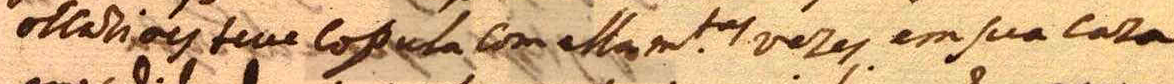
occazioẽs teue copula com ella m.tas vezes em sua caza
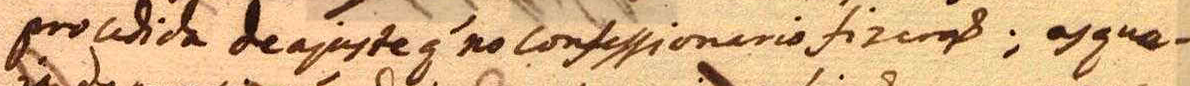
procedida de ajuste q̄ no confessionario fizeraõ; as qua
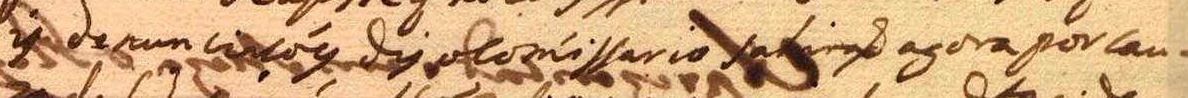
is denunciaçoẽs dis o comissario sahiraõ agora por cau
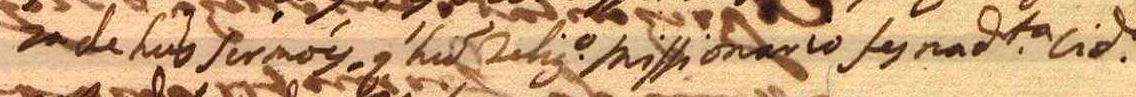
za de hus̄ sermoẽs, q̄ hū Relig.o missionario fes na d.ta cid.e
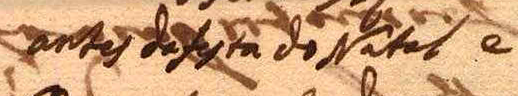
antes da festa do Natal e
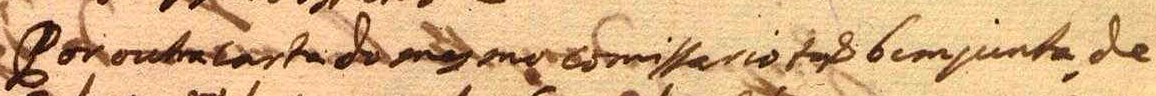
Por outra carta do mesmo comissario taõbem junta, de
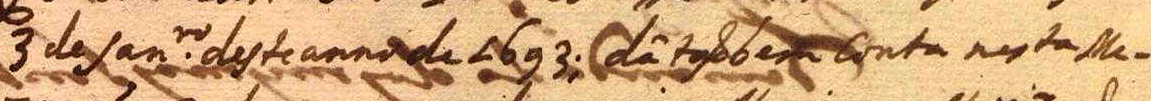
3 de jan.ro deste anno de 1693; dá taõbem conta nesta Me
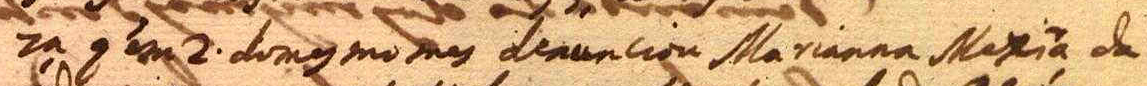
za, q̄ em 2. do mesmo mes denunciou Marianna Mexia da
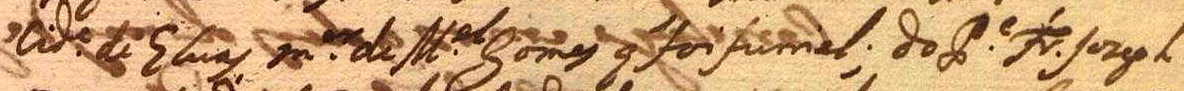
Cid.e de Eluas m.er de M.el Gomes q̄ foi furriel; do P.e Fr. Jozeph
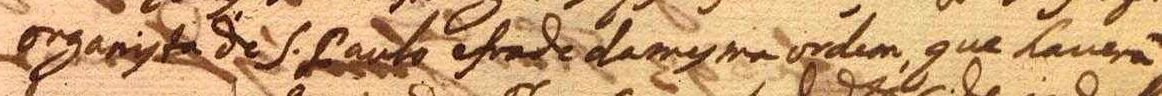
organista de S. Paulo e frade da mesma ordem, que hauerá
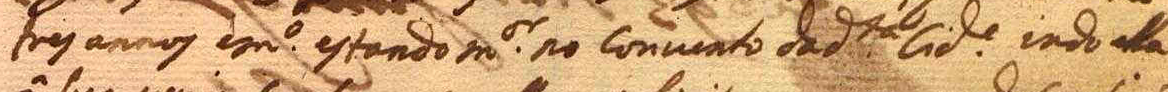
tres annos e m.o estando m.or no conuento da d.ta Cid.e indo ella
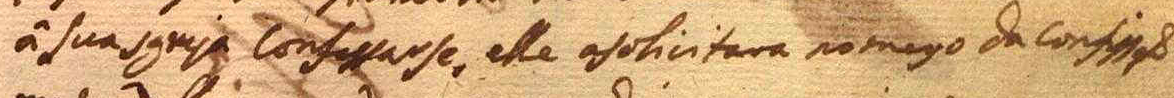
á sua jgreja confessarse, elle a solicitara no meyo da confissaõ
